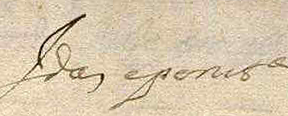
Jdas e penita
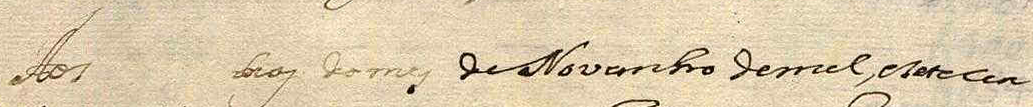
Aos dias do mes de Novembro de mil, e setecen
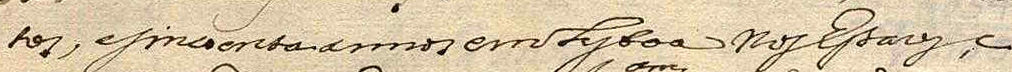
tos, e sincoenta annos em Lisboa nos Estaos, e
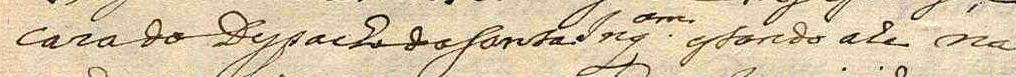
caza do Despacho da santa Inqcam estando ahi na
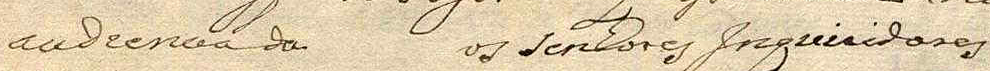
audiencia da os senhores Jnquizidores
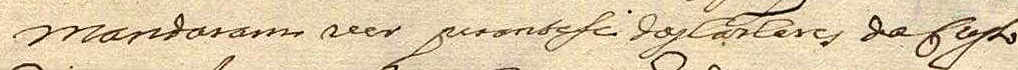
mandaram vir perante si dos CazCeres da Custo
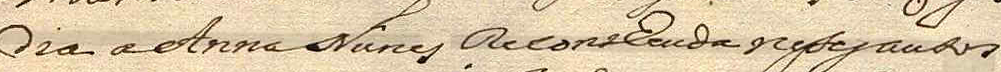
dia a Anna Nunes Re contheuda nestes autos
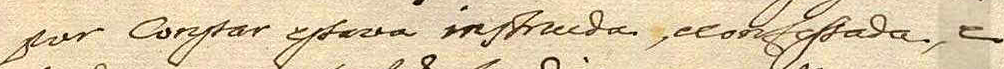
por constar estava instruida, e confessada, e
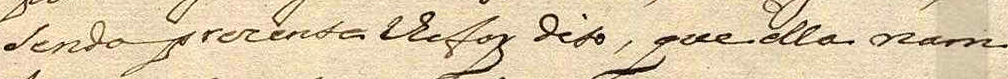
sendo prezente lhe foy dito, que ella nam
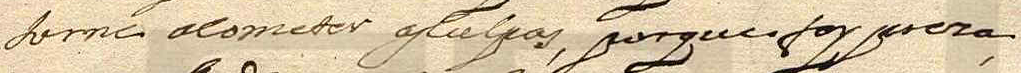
tomne a cometer as Culpas, porque foy preza,
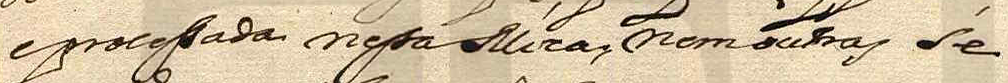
e processada nesta Meza, nem outras se
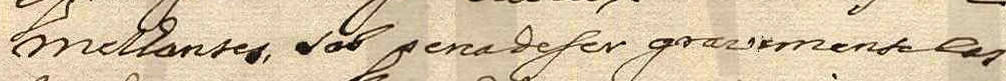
melhantes, sob pena de ser gravemente cas
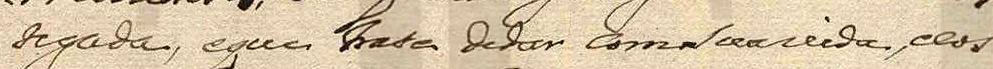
tigada, e que trata de dar com sua vida, e cos
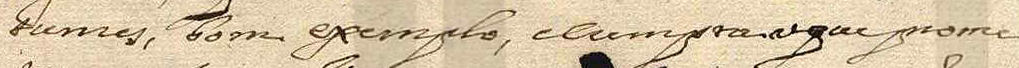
tumes, bom exemplo, e cumpra o que prome
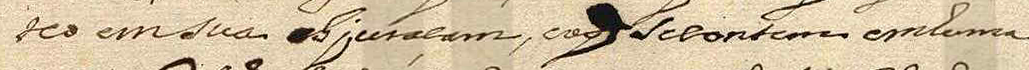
teo em sua abjuraçam, e o q se contem em huma
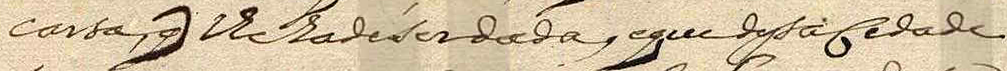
carta, q̄ lhe ha de ser dada, e que desta Cidade
